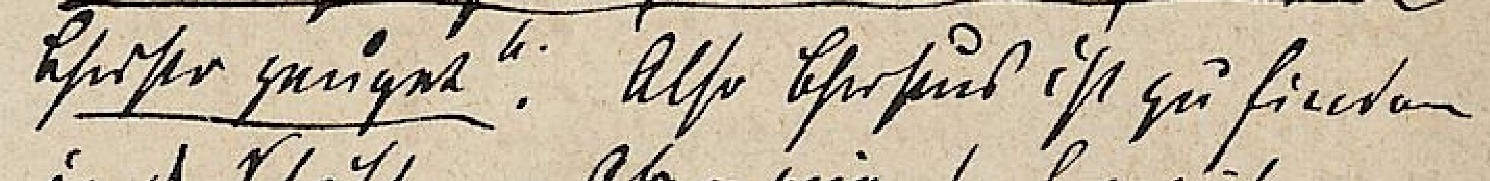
Christo zeuget." Also Christus ist zu finden
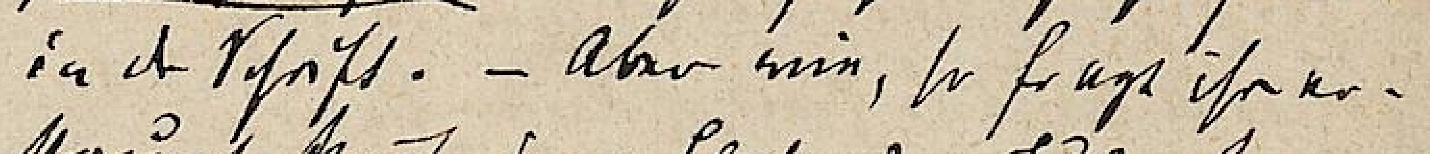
in dr Schrift._ Aber wie, so fragt ihr er¬
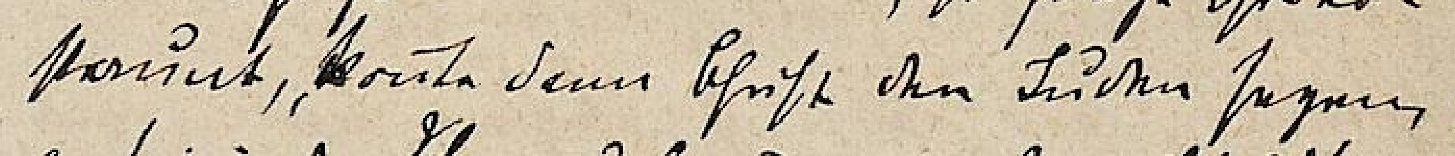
staunt, konte denn Christ den Juden sagen,
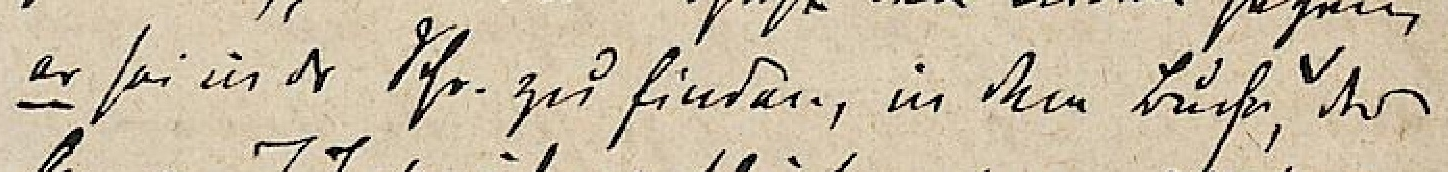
er sei der Schr. zu finden, in dem Buche, das
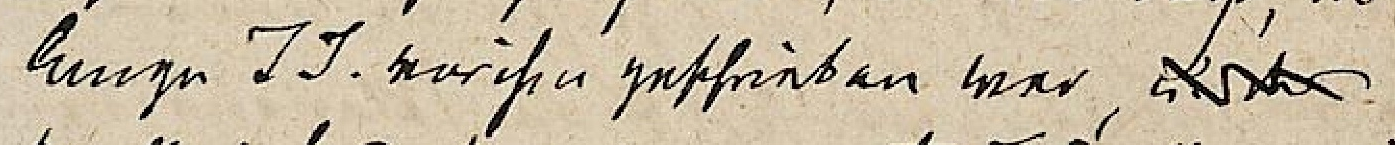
lange JJ. vor ihm geschrieben war, u. das
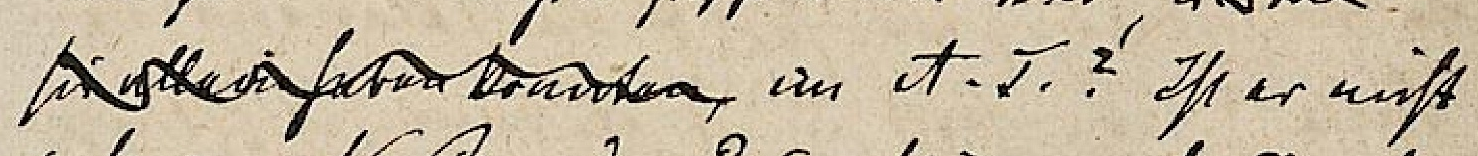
sie allein haben konnten, im A.T.? Ist er nicht
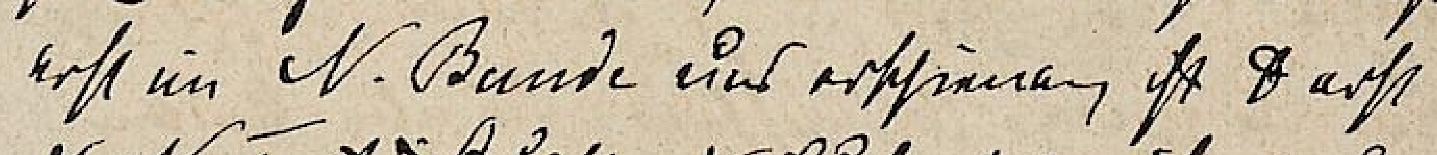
erst im N. Bunde uns erschienen, ist o erst
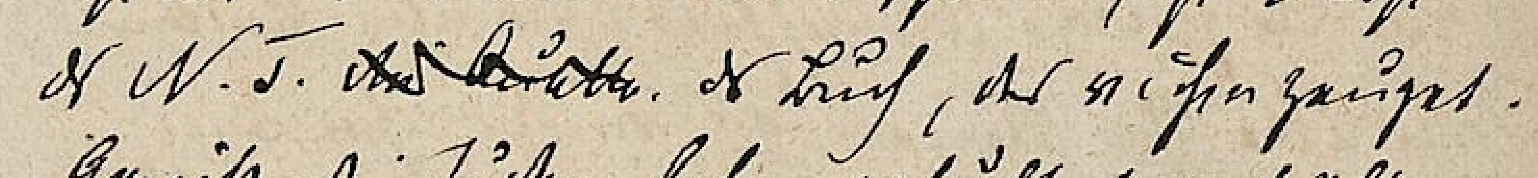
ds N.T. die Quelle. ds Buch, das v. ihm zeugt.
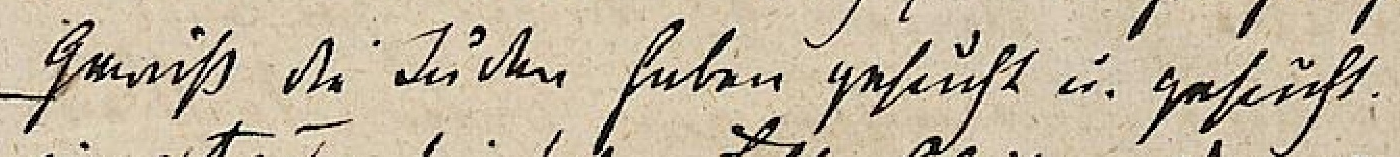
Gewiß die Juden haben gesucht u. gesucht.
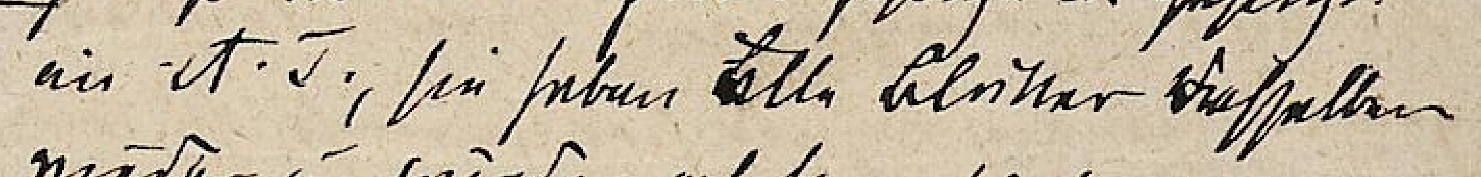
ein A.T., sie haben alle Blätter dessellben
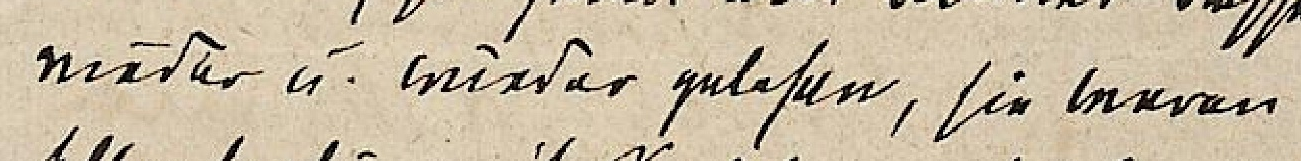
wieder u wieder gelesen, sie waren
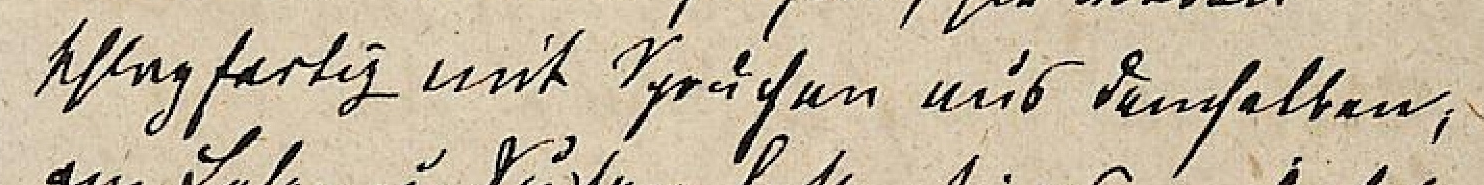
schlagfertig mit Schrüchen aus demselben,
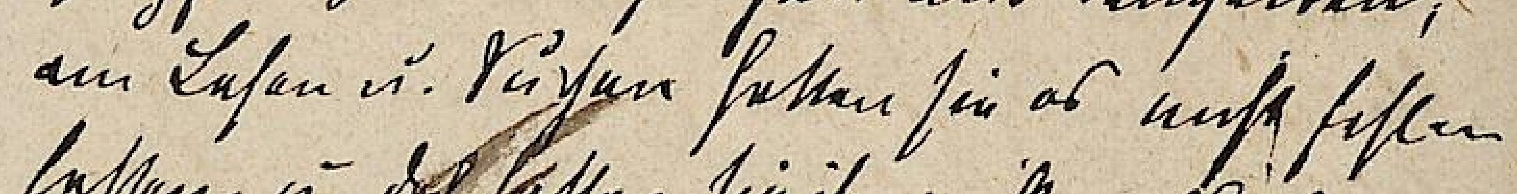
am Lesen u. Suchen hatten sie es nicht fehlen
